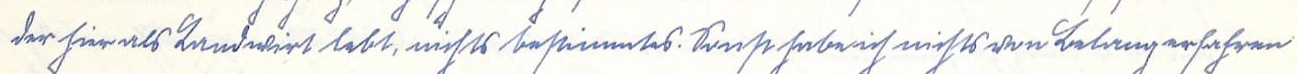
der hier als Landwirt lebt, nichts bestimmtes. Sonst habe ich nichts von Belang erfahren
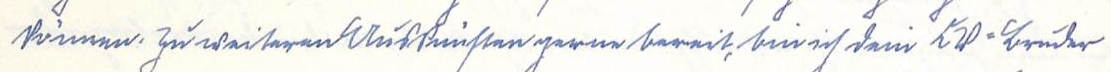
können. Zu weiteren Auskünften gerne bereit, bin ich dein CV-Bruder
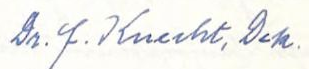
Dr. F. Knecht, Dek.
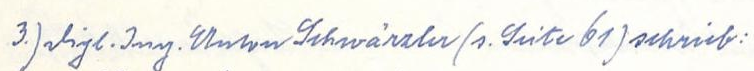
3) Dipl. Ing. Anton Schwarzer (Seite 61) schrieb:
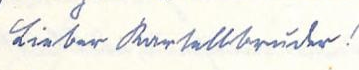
Lieber Kartell-Bruder!
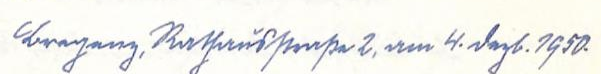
Bregenz, Rathausstraße 2, am 4. Dezember 1950.
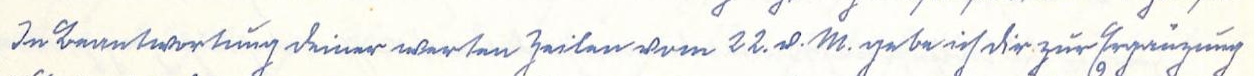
In Beantwortung deiner werten Zeilen vom 22. v. M. gebe ich dir zur Ergänzung
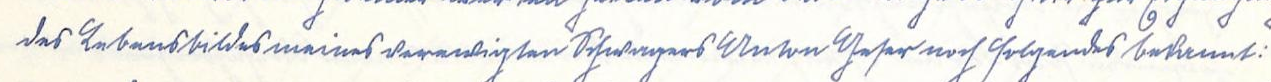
des Lebensbildes meines verewigten Schwagers Anton Glaeser noch folgendes bekannt:
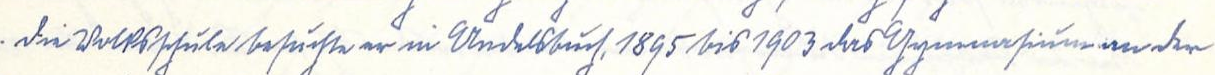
… Die Volksschule besuchte er in Andelsbuch, 1895- bis 1903, das Gymnasium an der
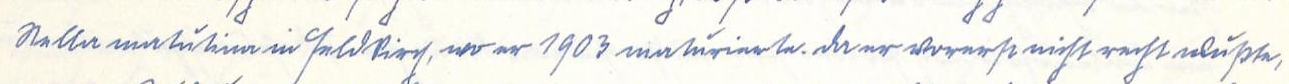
Stella matutina in Feldkirch, wo er 1903 maturierte. Da er vorerst nicht recht wußte,
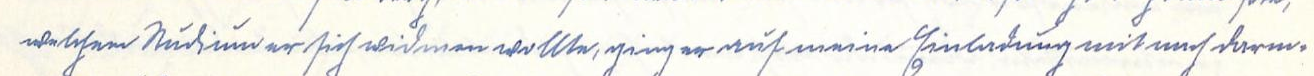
welchem Studium er sich widmen wollet, ging er auf meine Einladung mit nach Darm-
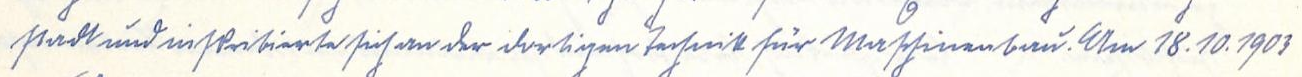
stadt und inskribierte sich an der dortigen Technik für Maschinenbau. Am 18.10.1903
